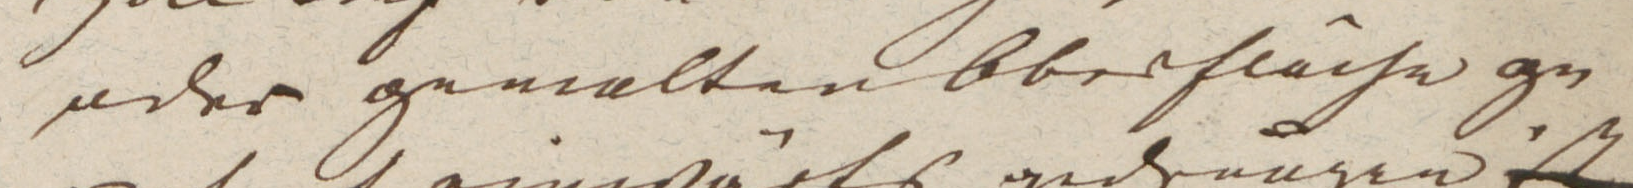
oder gemalten Oberfläche ge
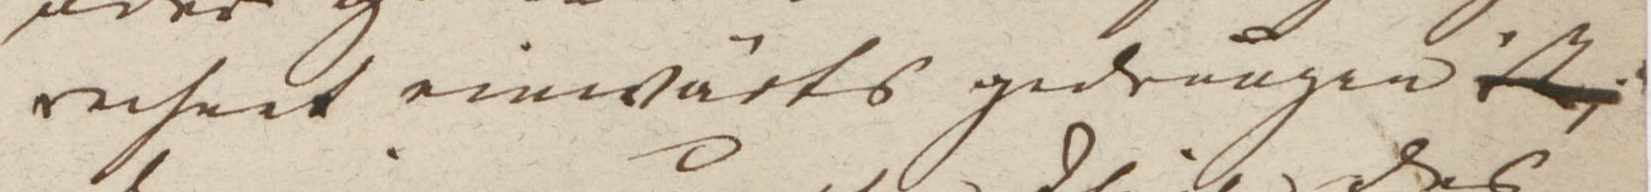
rechnet einwärts gedrungen ist;
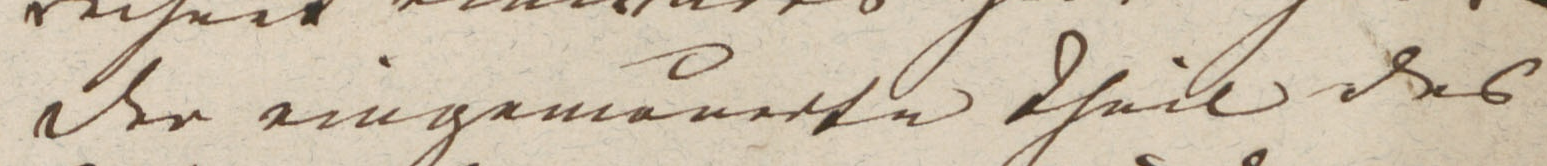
Der eingemauerte Theil des
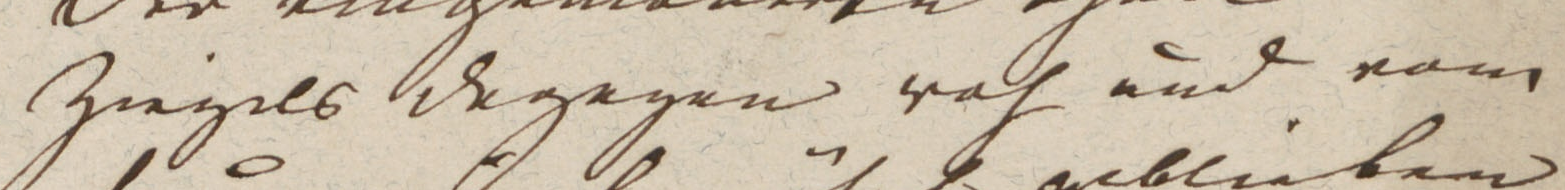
Ziegels dagegen roh und vom
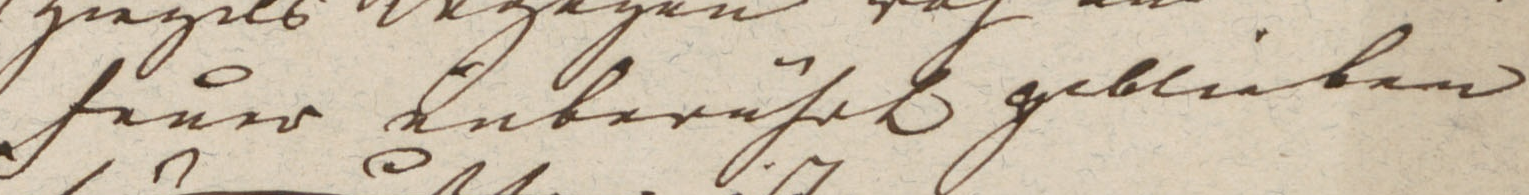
Feuer unberührt geblieben
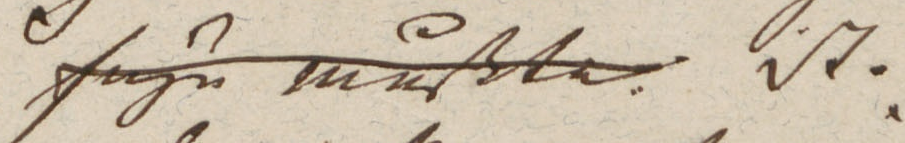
seyn musste. ist.
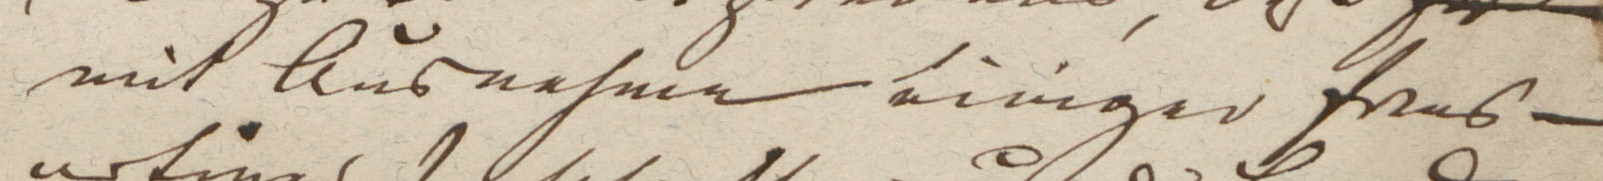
mit Ausnahme einiger fries-
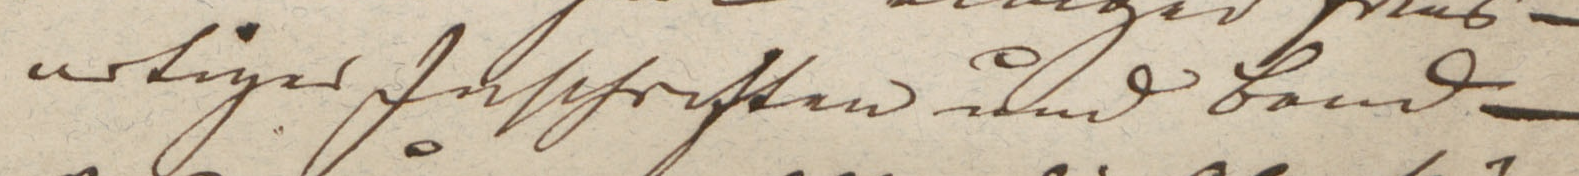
artiger Inschriften und Band-
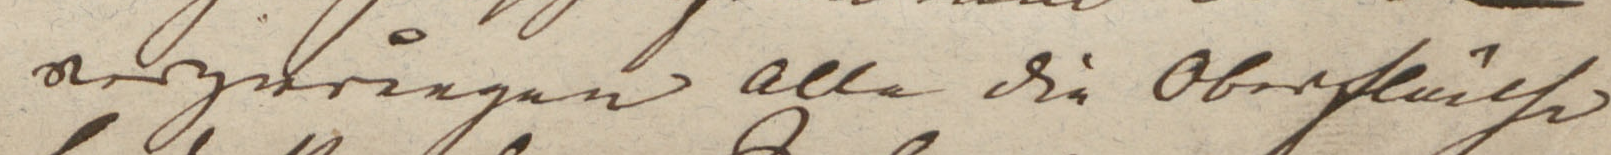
verzierungen lle die Oberfläche
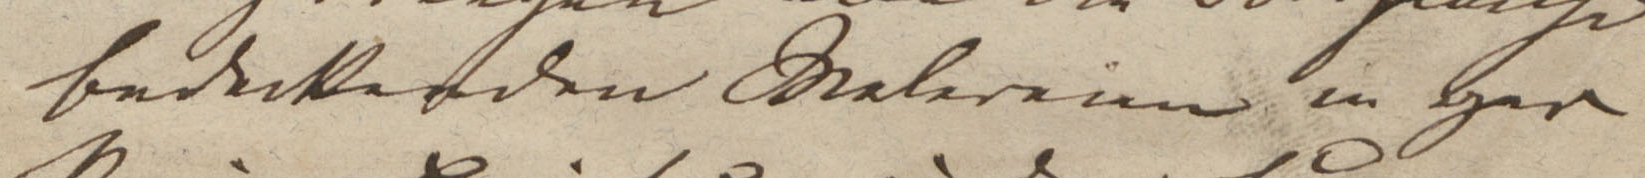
bedeckenden Malereien in gar
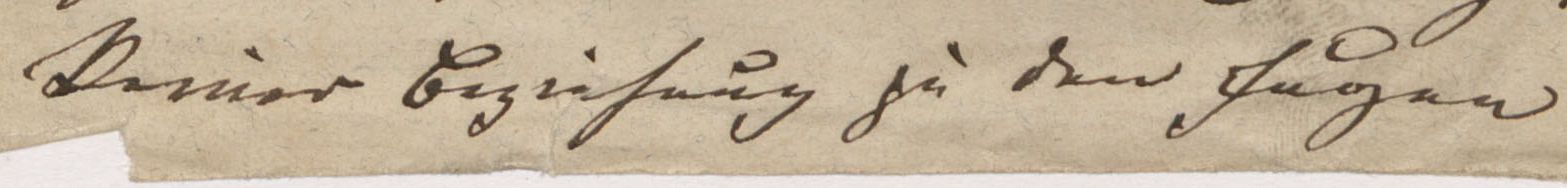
keiner Beziehung zu den Fugen
